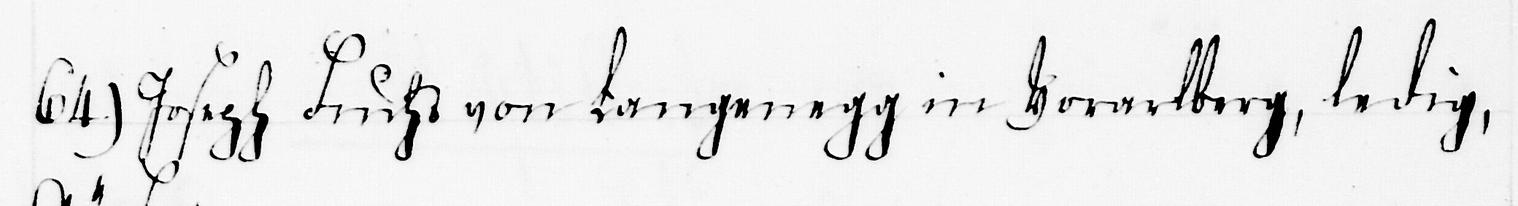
64.) Joseph Fuchs von Langenegg in Vorarlberg, ledig,
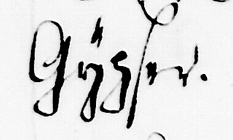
Gypser.
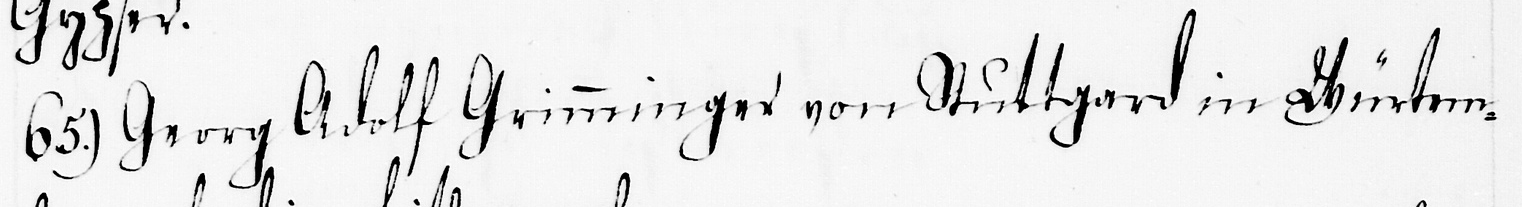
65.) Georg Adolf Grimminger von Stuttgard in Würtem¬
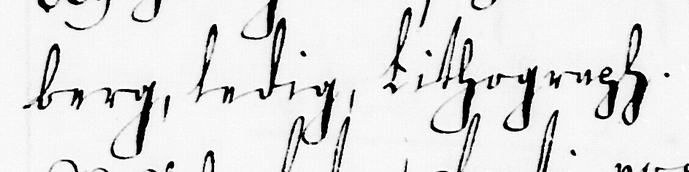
berg, ledig, Lithograph.
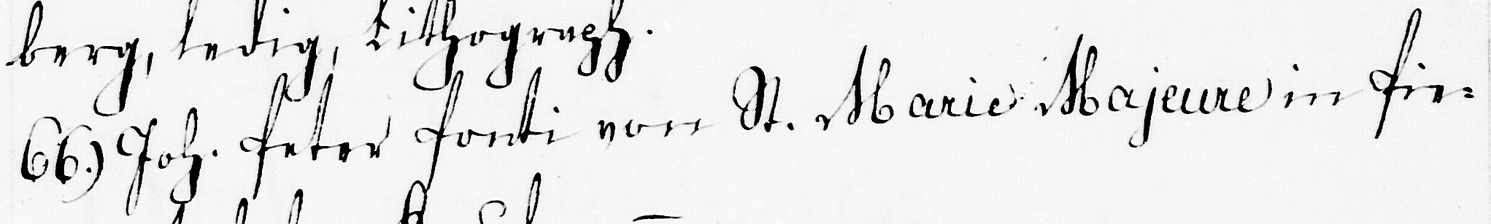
66.) Joh. Peter Ponti von St. Marie Majeure in Pie¬
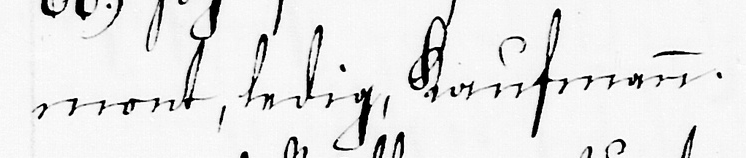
mont, ledig, Kaufmann.
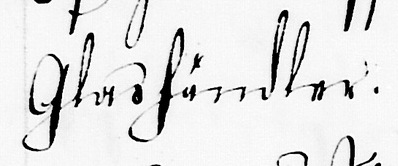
Glashändler.
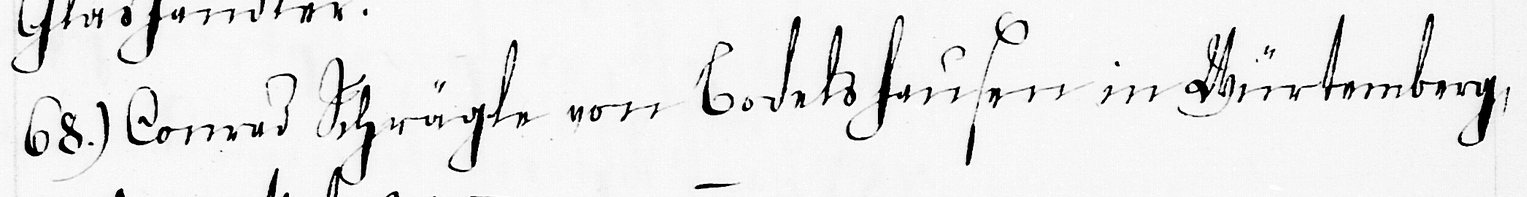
68.) Conrad Schrägle von Bodelshausen in Würtemberg,
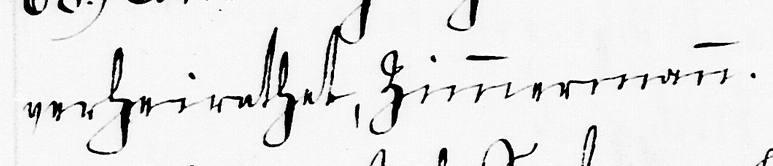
verheirathet, Zimmermann.
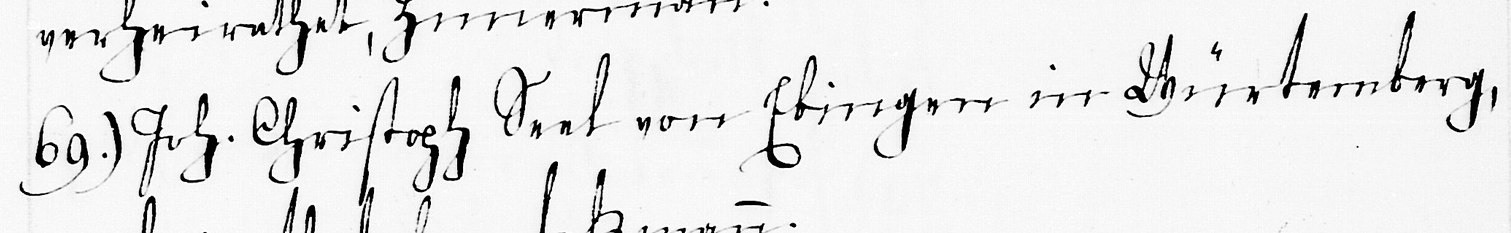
69.) Joh. Christoph Seel von Ebingen in Würtemberg,
